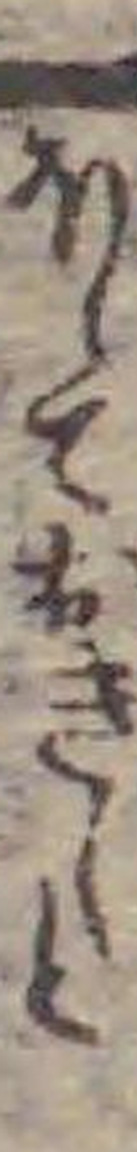ほしてきしと
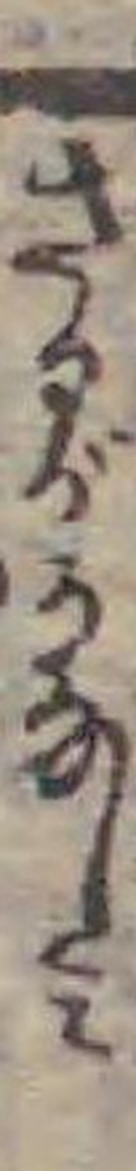さるがかなしみ
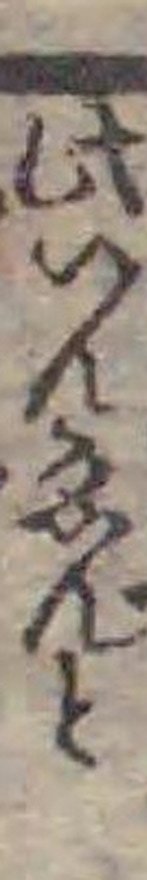此いんゑんと
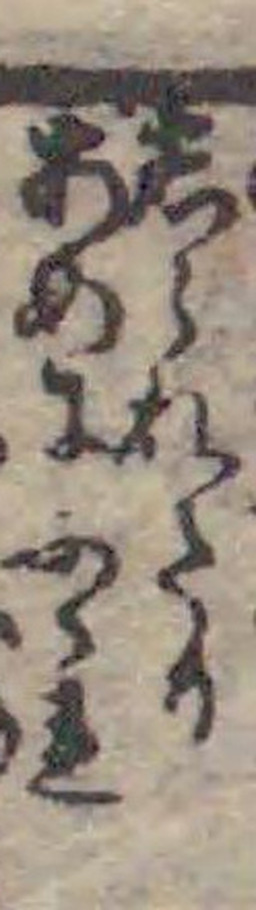あめにふられ
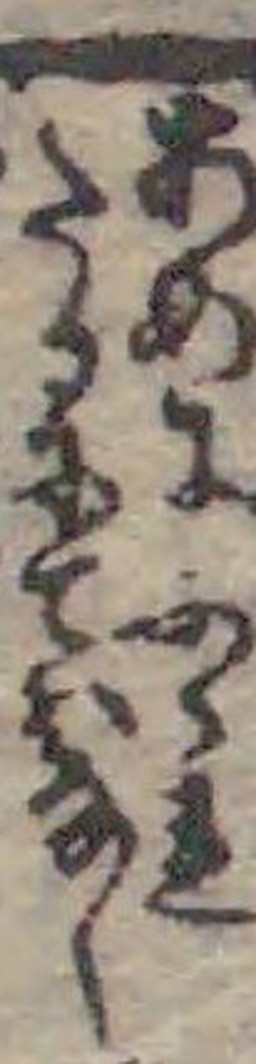たるにてはなく
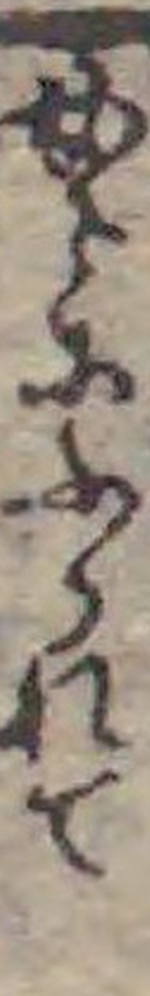女郎にふられて
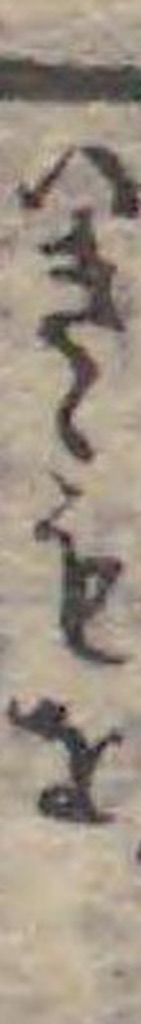いきゝもを
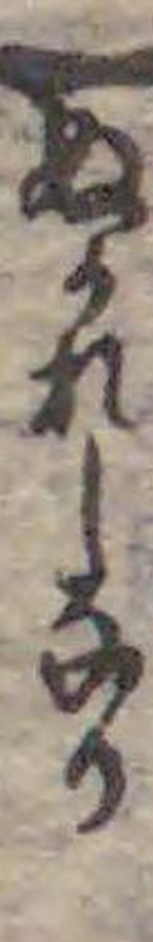ぬかれしなり
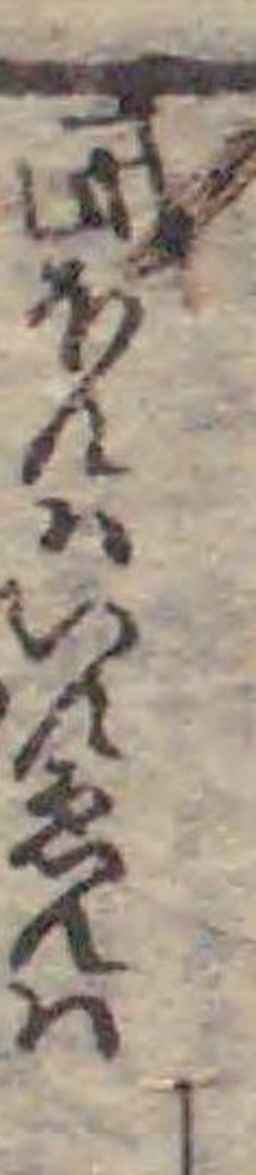〽此ほんはいんゑんは
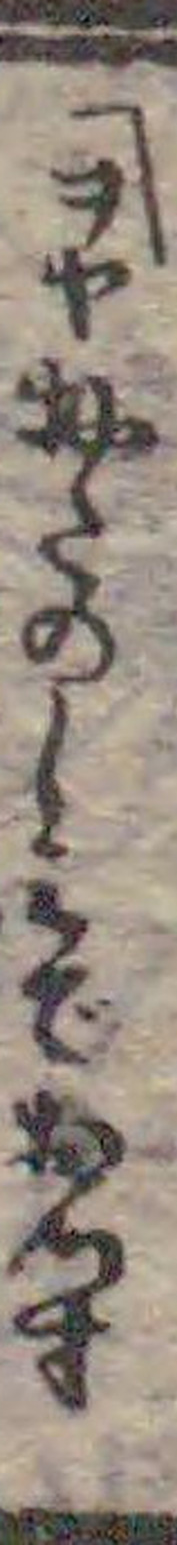〽ヲヤおたのしみでおつす
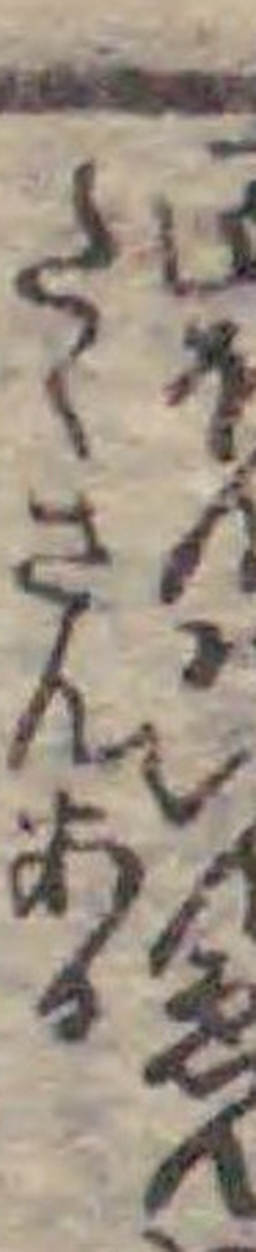たくさんある
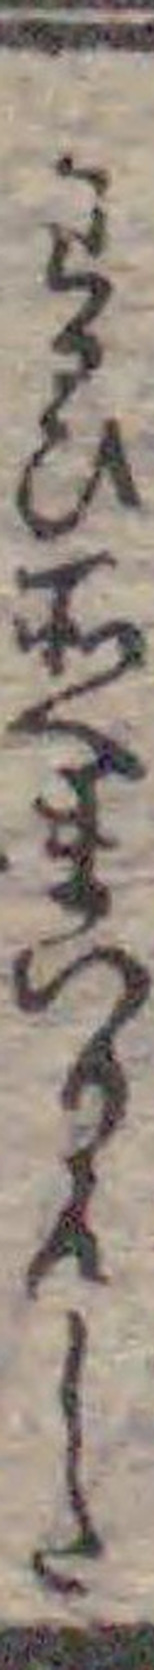わるひ所へまいりんした
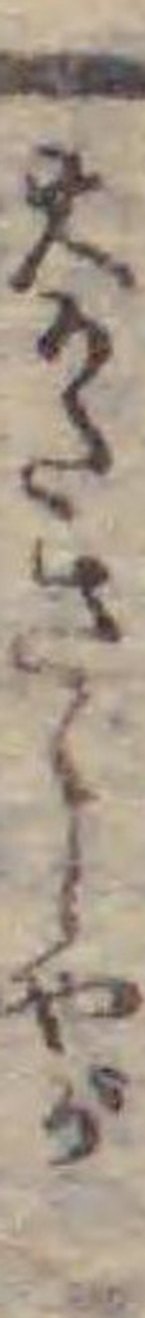大かたさくしやが
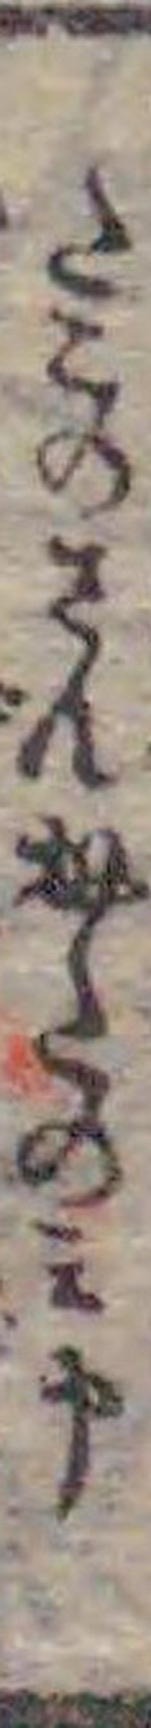たこのさんおたのみ申
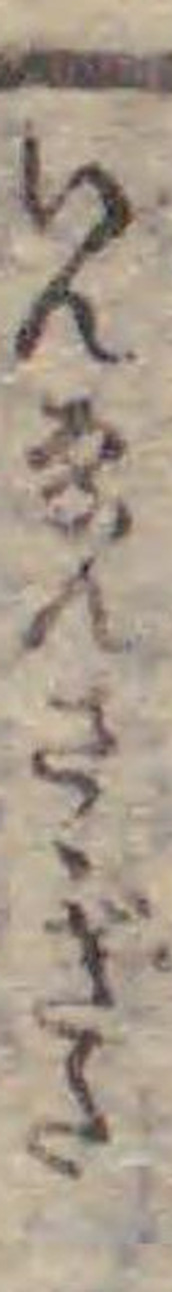いんゑんさくぎた
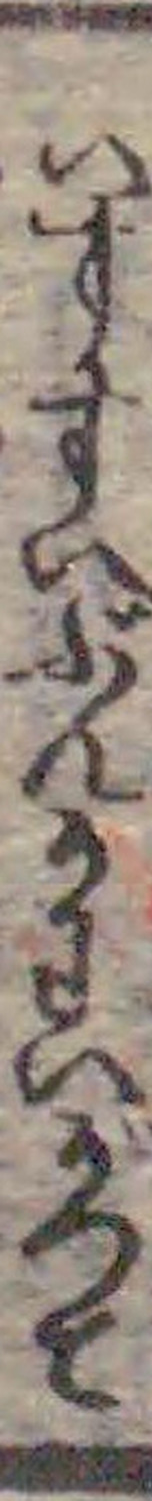いすすいぶんかわいがつて
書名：竜宮苦界玉手箱 : 3巻
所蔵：国立国会図書館 National Diet Library, JAPAN
